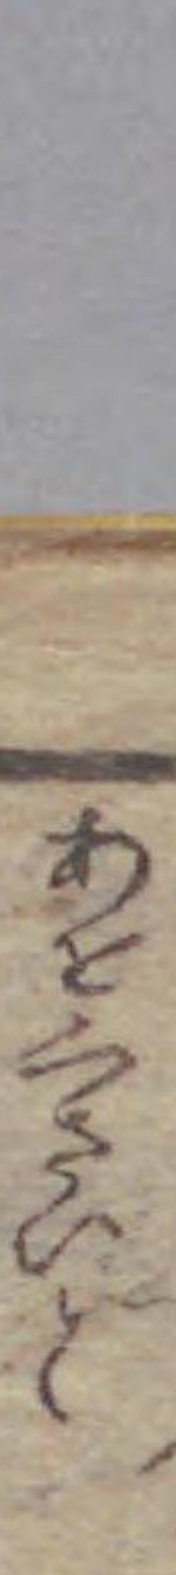あをくさいと
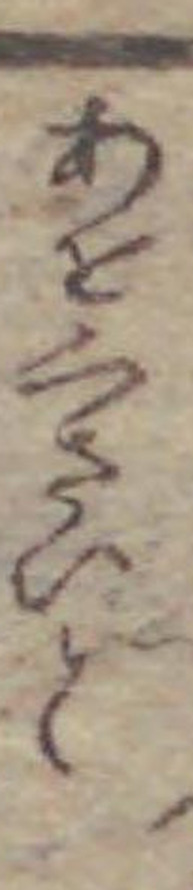あをくさいと
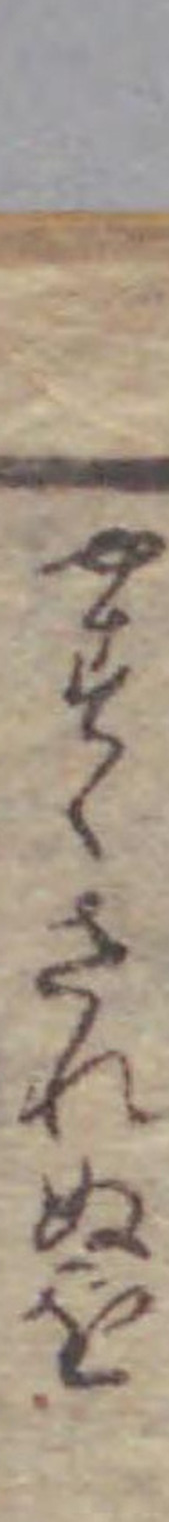やすくされぬを
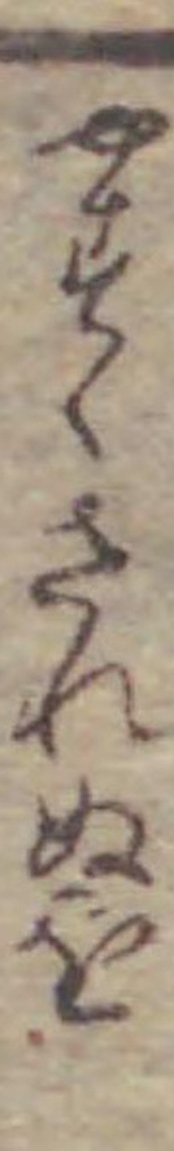やすくされぬを
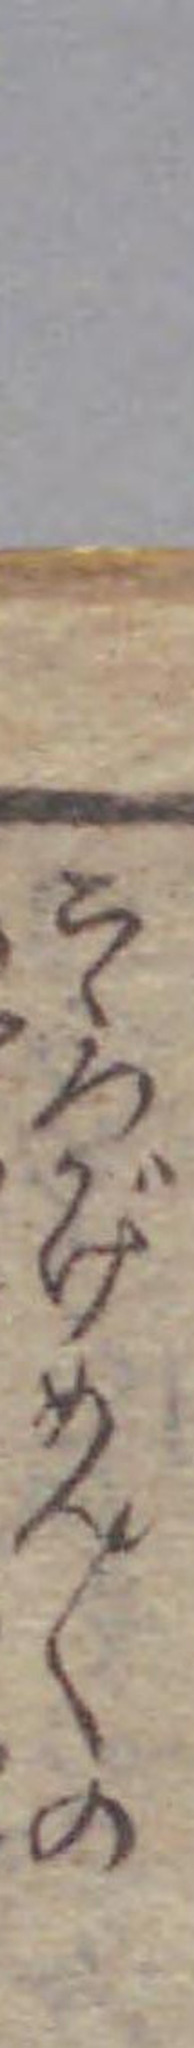こゝろがけめん〳〵の
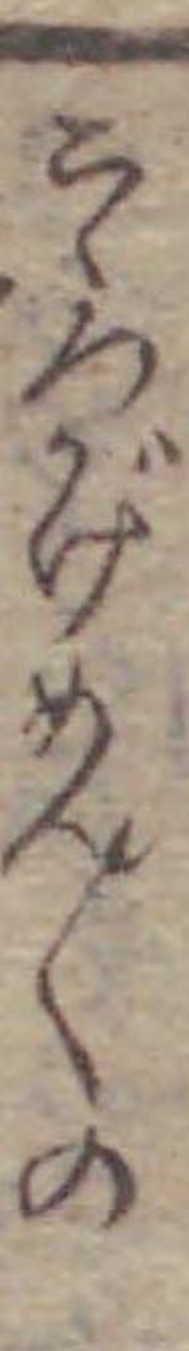こゝろがけめん〳〵の
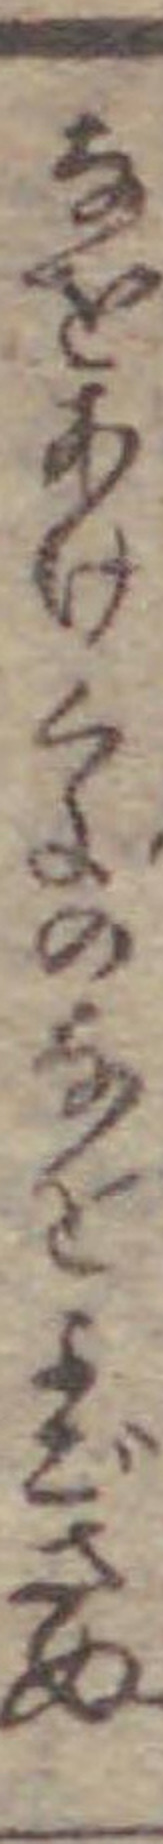なをあけくになをよごさぬ
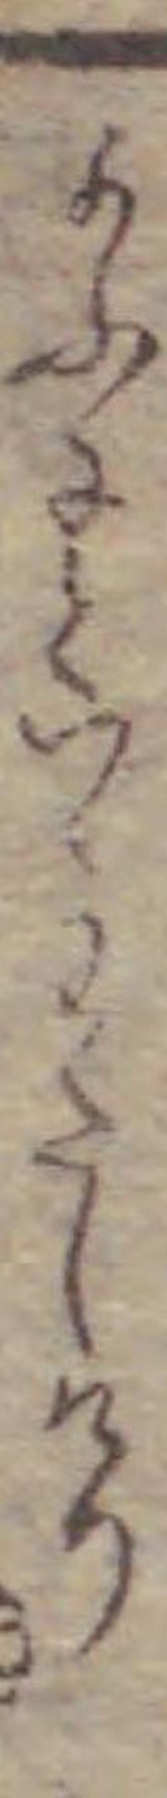よふにといゝわたしけり

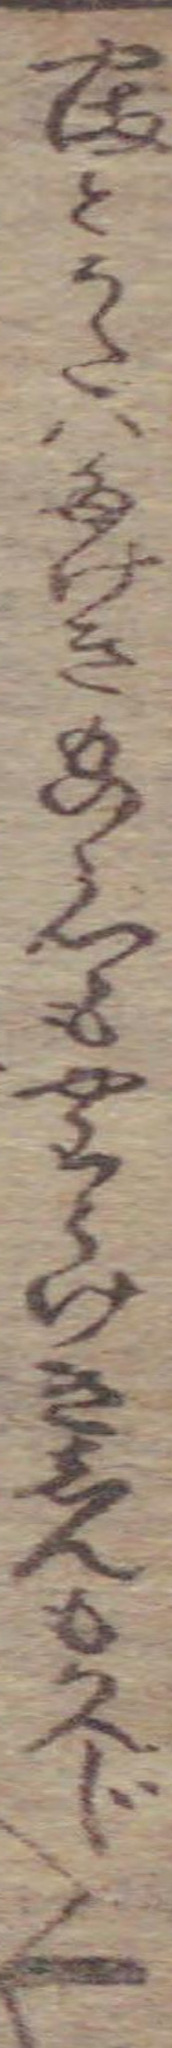まとうたはたけきものゝ心もやわらけきしんもかんじ
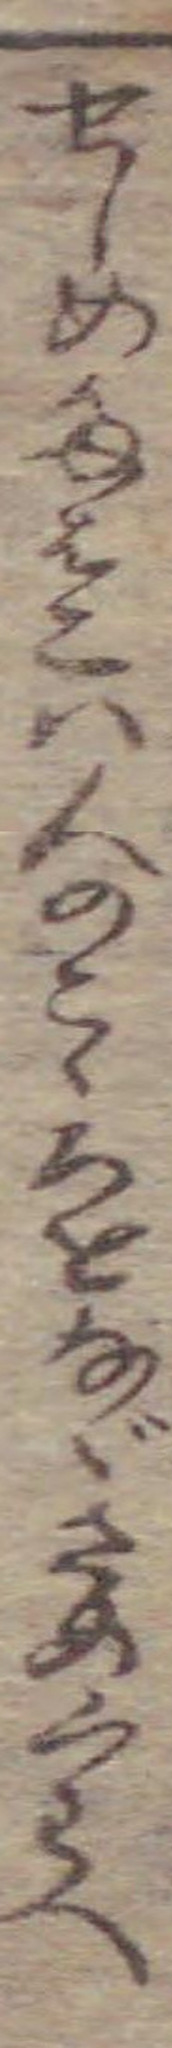せしめたはこは人のこゝろをなぐさめくわへ
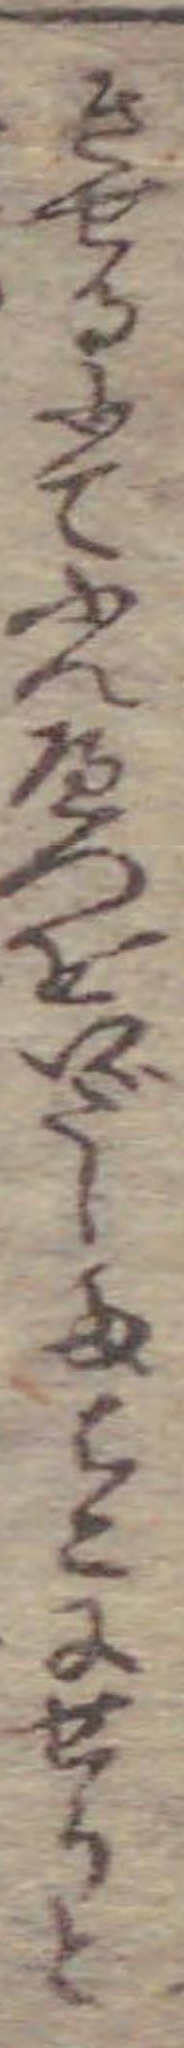きせるにてふんへつをいだしたはこにせうと
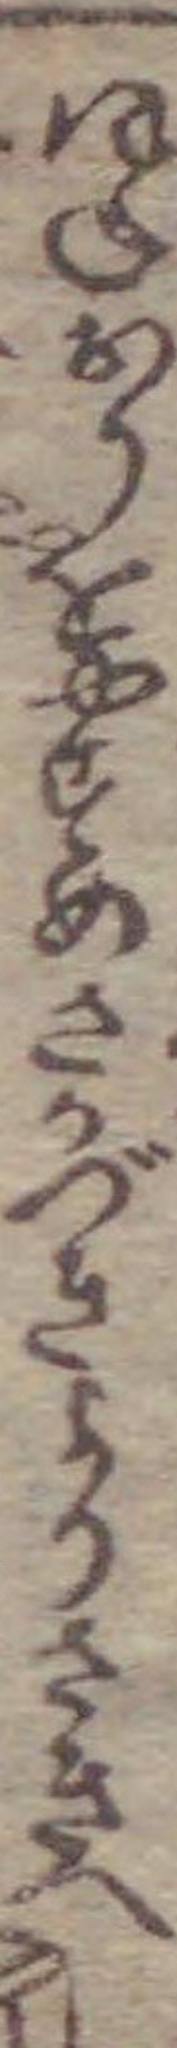ほねおりをやすめさかづきよりさきへ
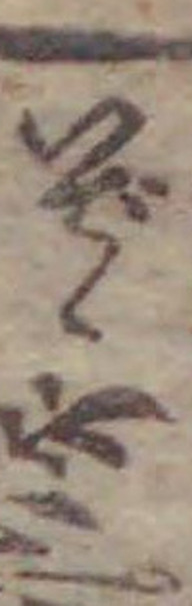いでゝ
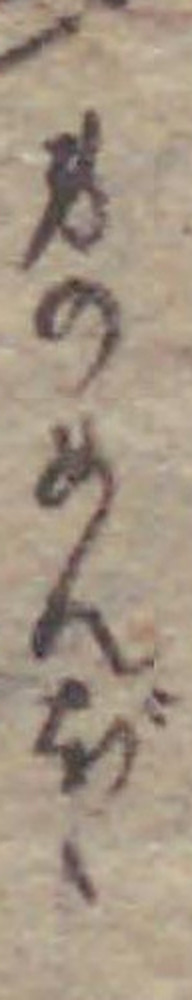身のめんぼく
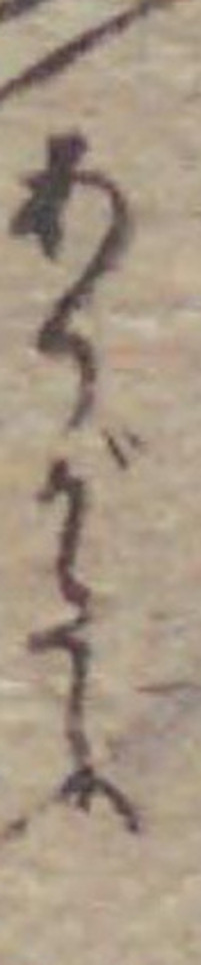ありがたふ
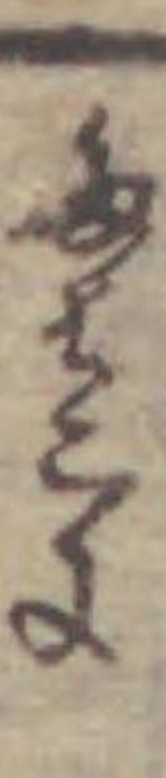たはこに
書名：談芭菰誉詞 : 3巻
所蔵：国立国会図書館 National Diet Library, JAPAN
